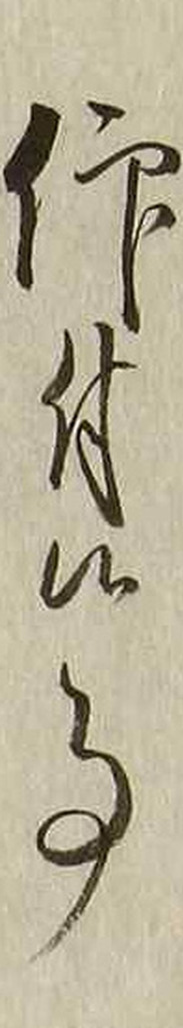仰付候事
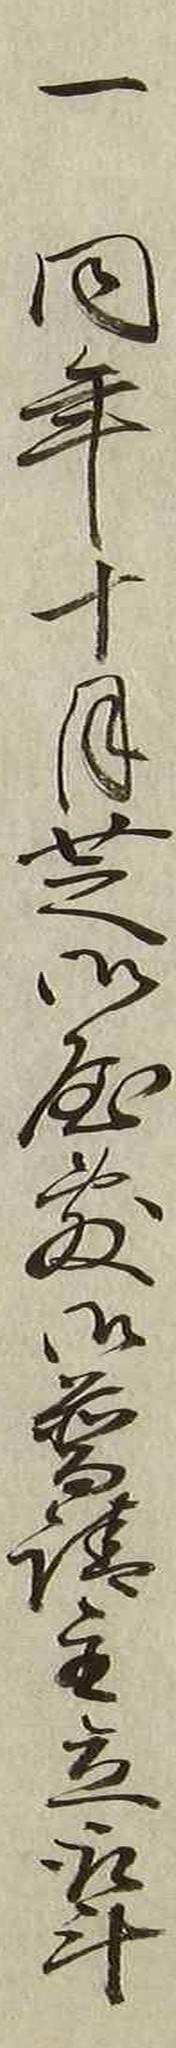一同年十月芝御屋敷御普請主立取斗
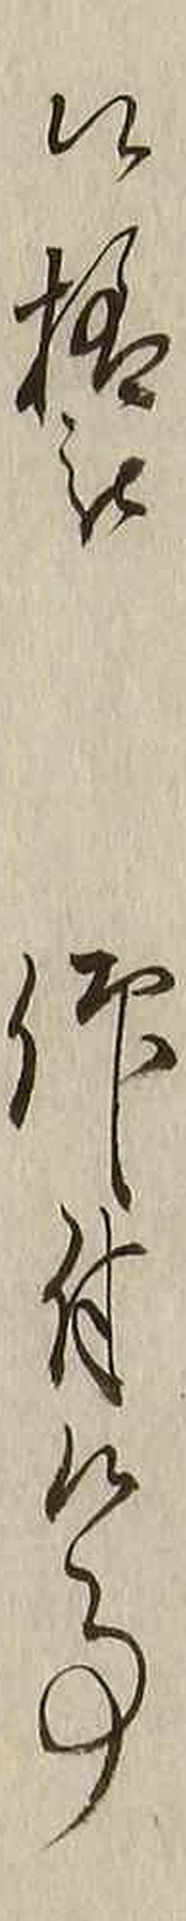候様被仰付候事
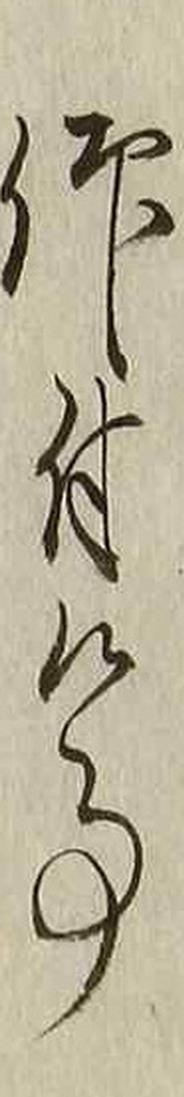仰付候事
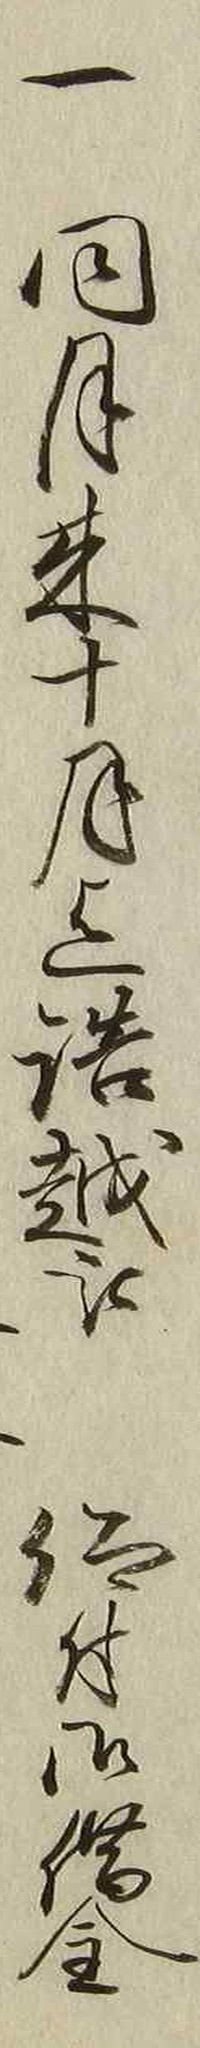一同月来十月迄詰越被仰付御借金
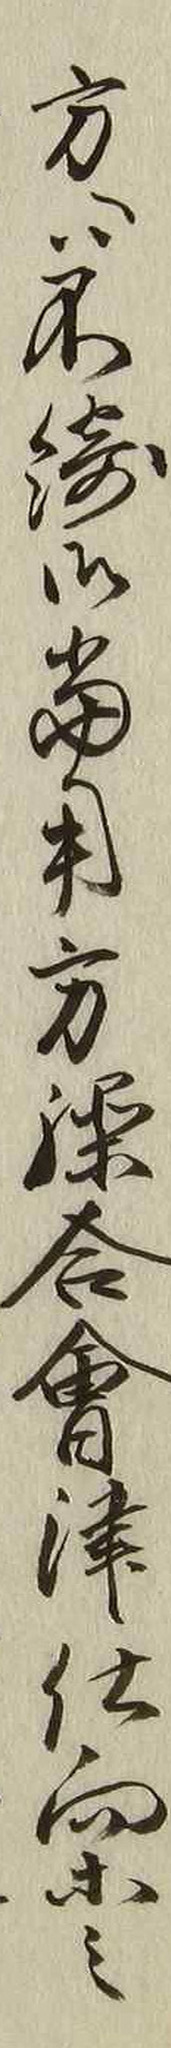方へハ不綺御当用方繰合会津仕向等之
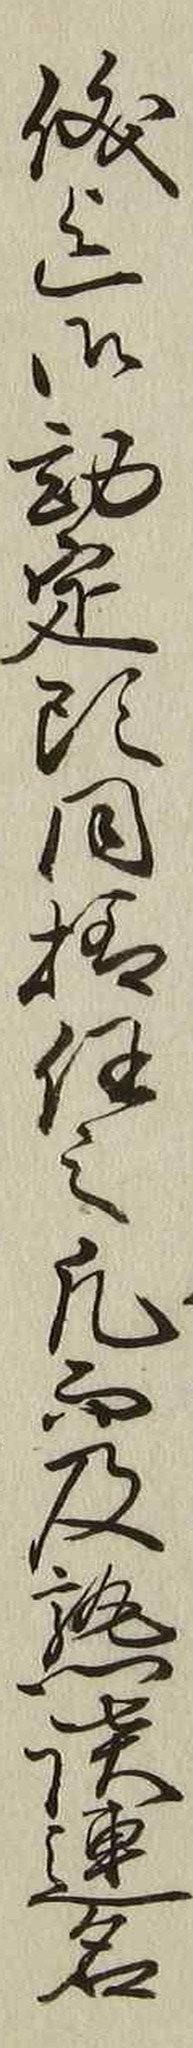儀迄御勘定頭同様任之凡而及熟談連名
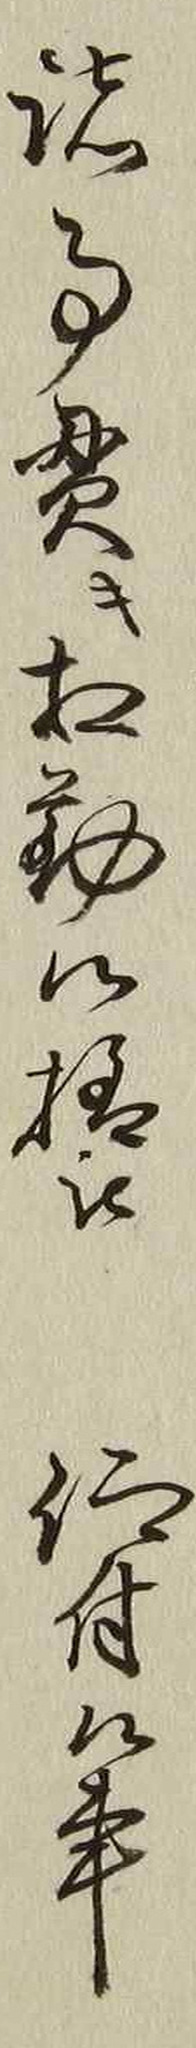諸事貫キ相勤候様被仰付候事
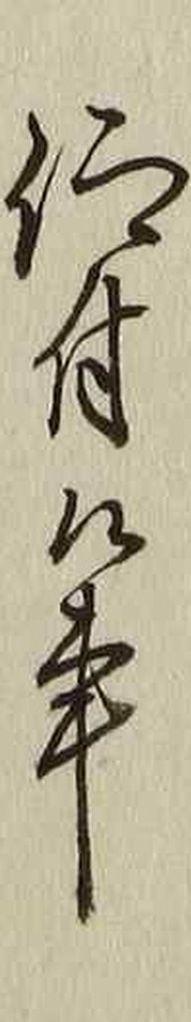仰付候事
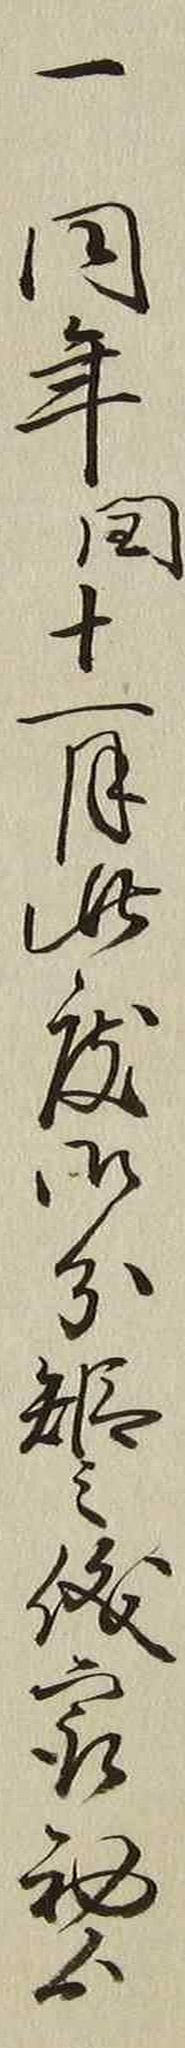一同年閏十一月此度御分矩之儀最初ゟ
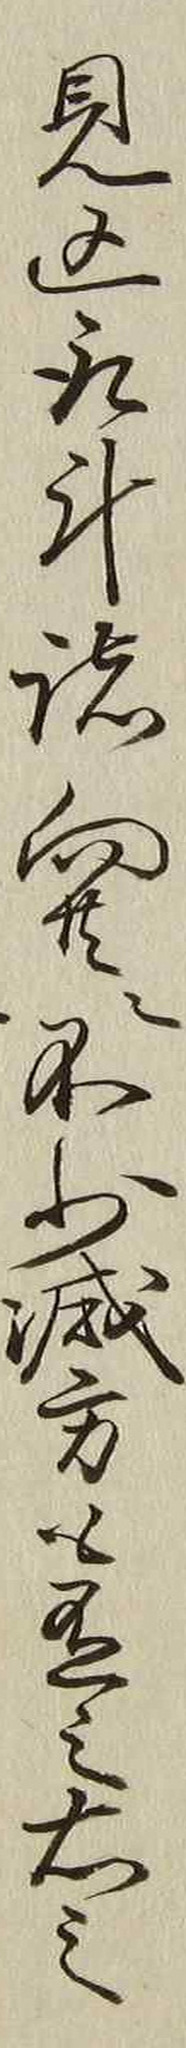見込取斗諸向共ニ不少減方も有之右之
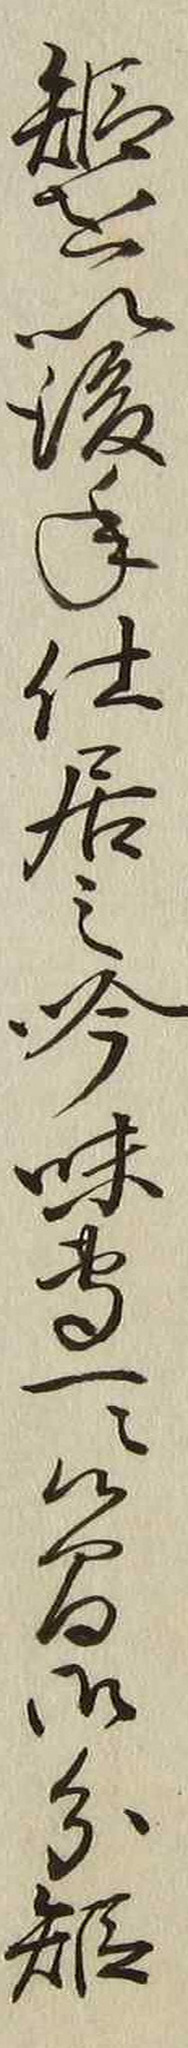矩を以後年仕居之吟味専一ニ候間御分矩
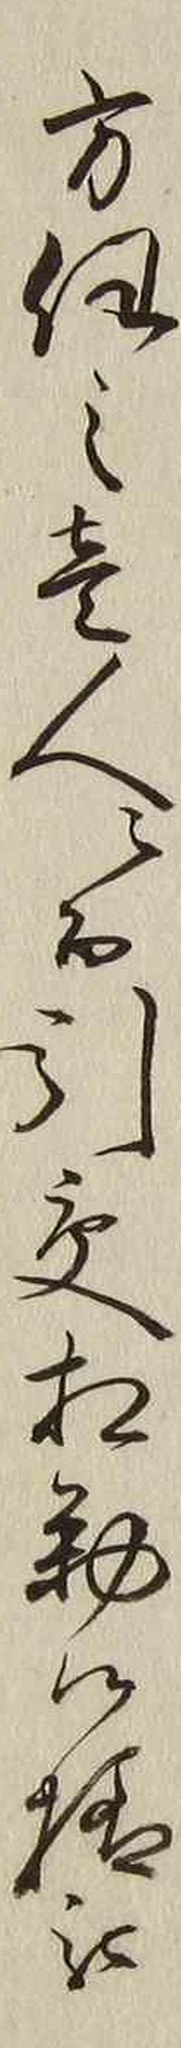方任之壱人ニ而引受相勤候様被
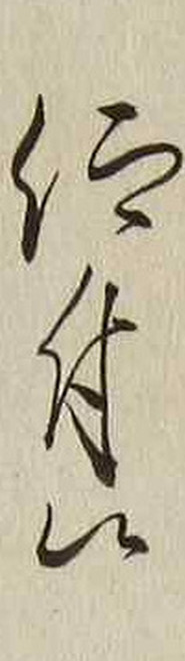仰付候
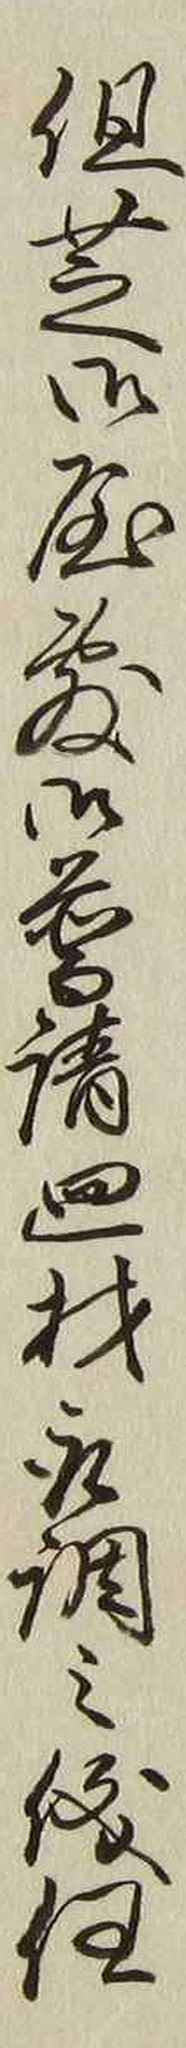但芝御屋敷御普請廻材取調之儀任
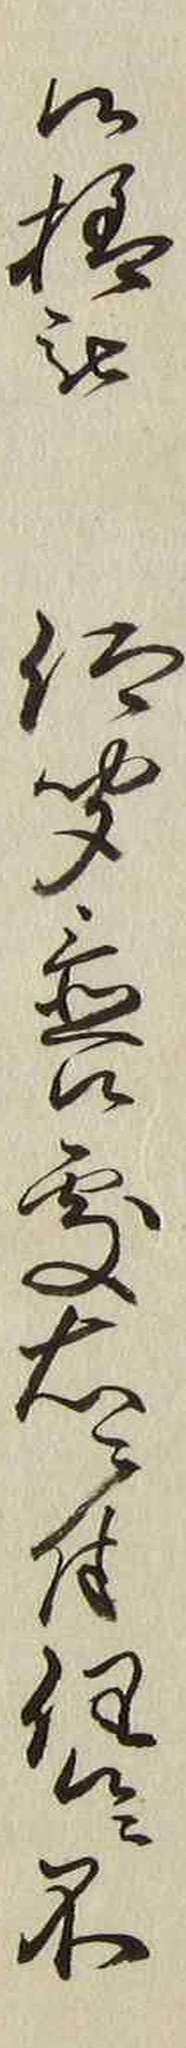候様被仰聞置候処右ニ付任候ニ不
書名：諸士系譜　巻之21　い之部21
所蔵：会津若松市立会津図書館
